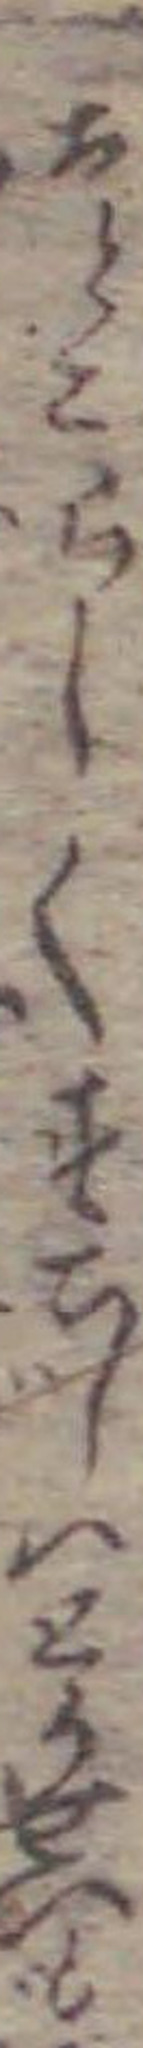おとこらしくすこしはとうせいも
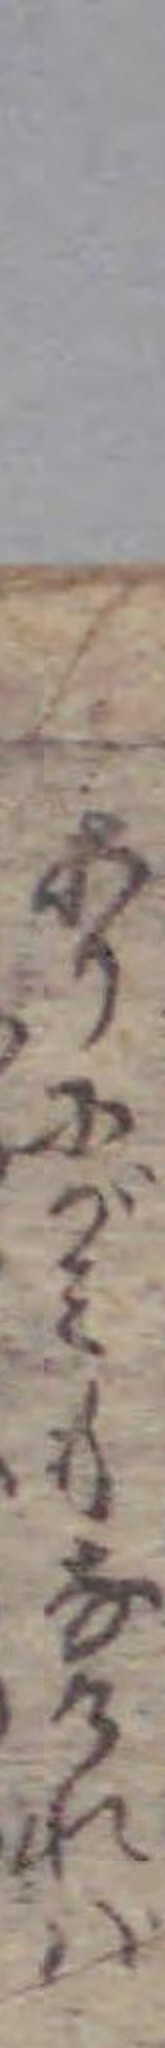ありにがみもなければ
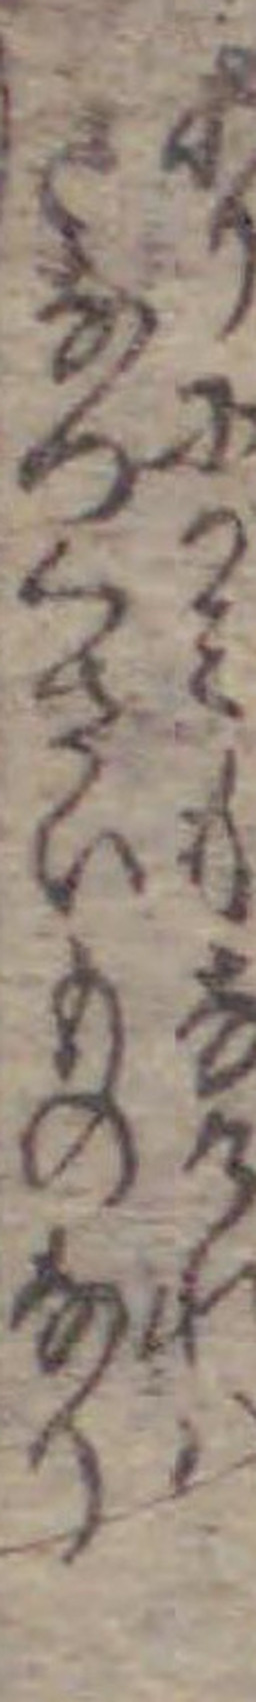きなつくさいものなり

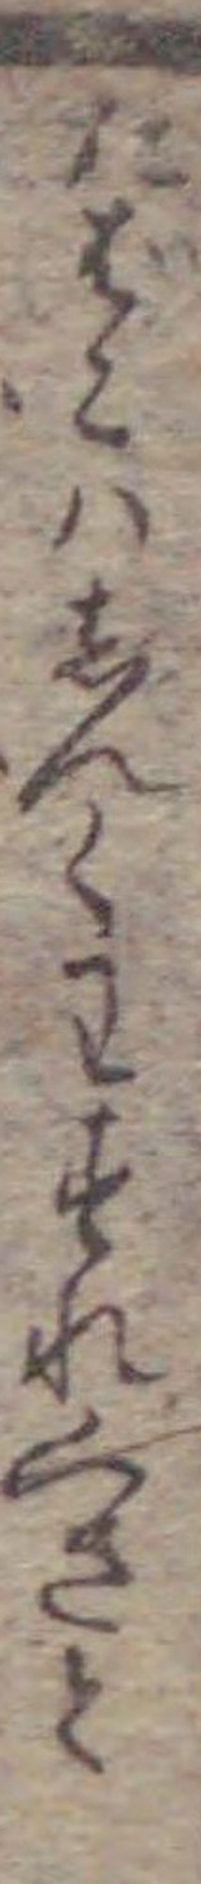たばこはしんくわすれくさと
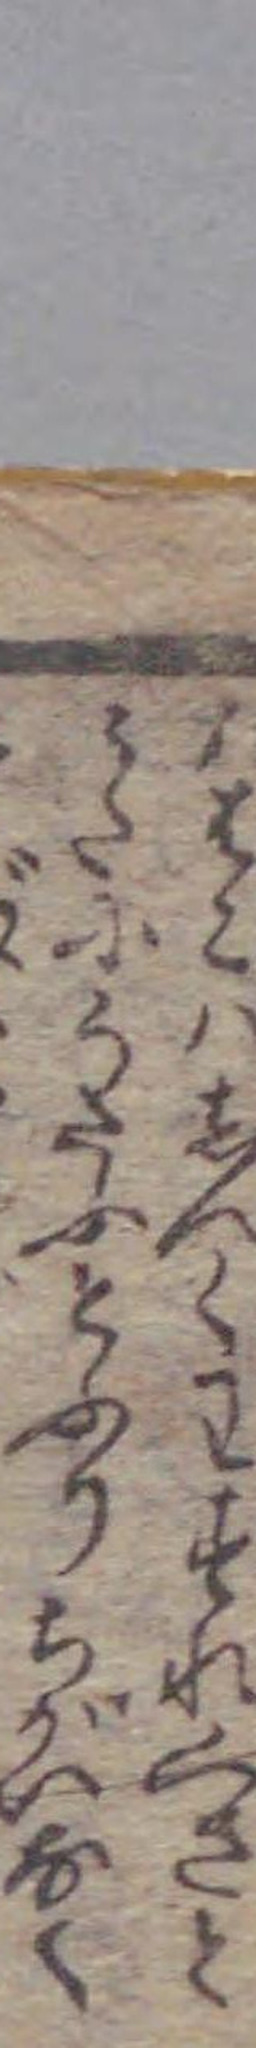うたにうたふとふりちがいなく
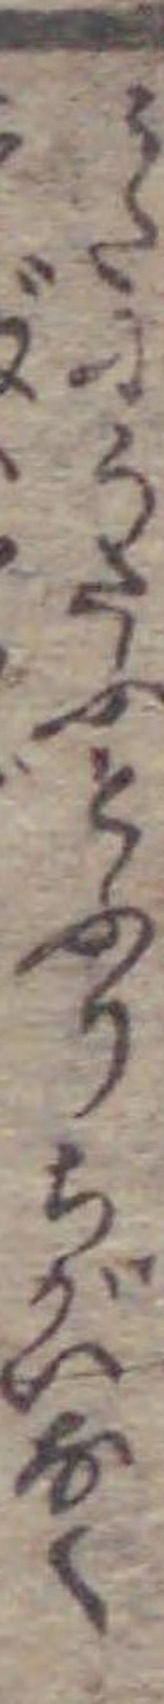うたにうたふとふりちがいなく
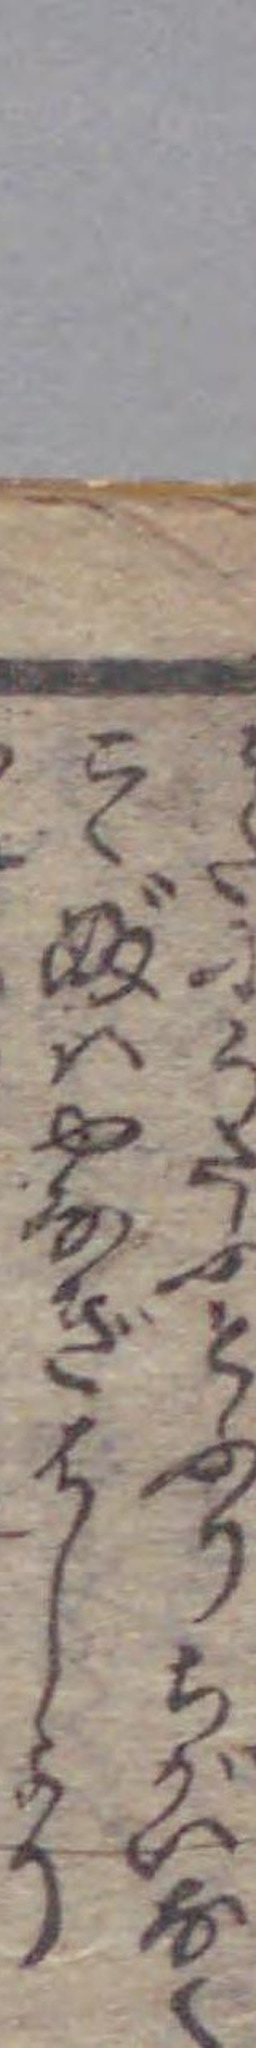こゝぶはやなぎはしより
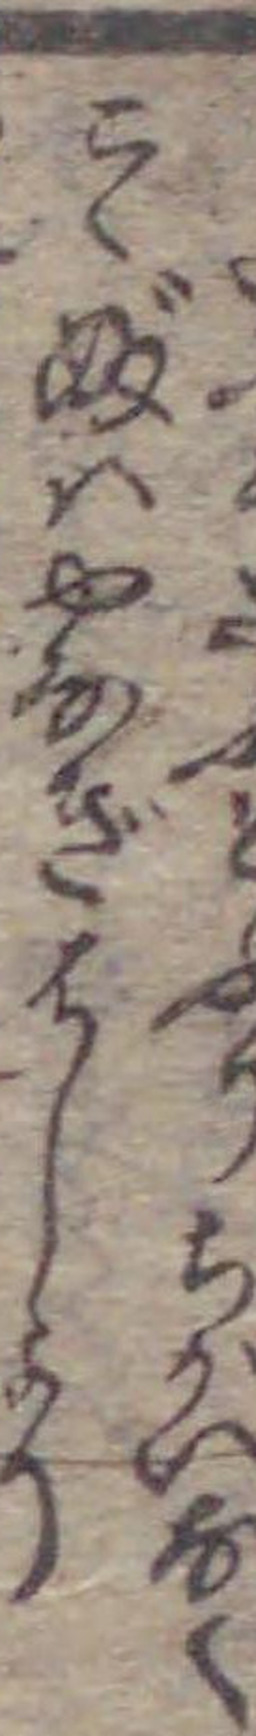こゝぶはやなぎはしより
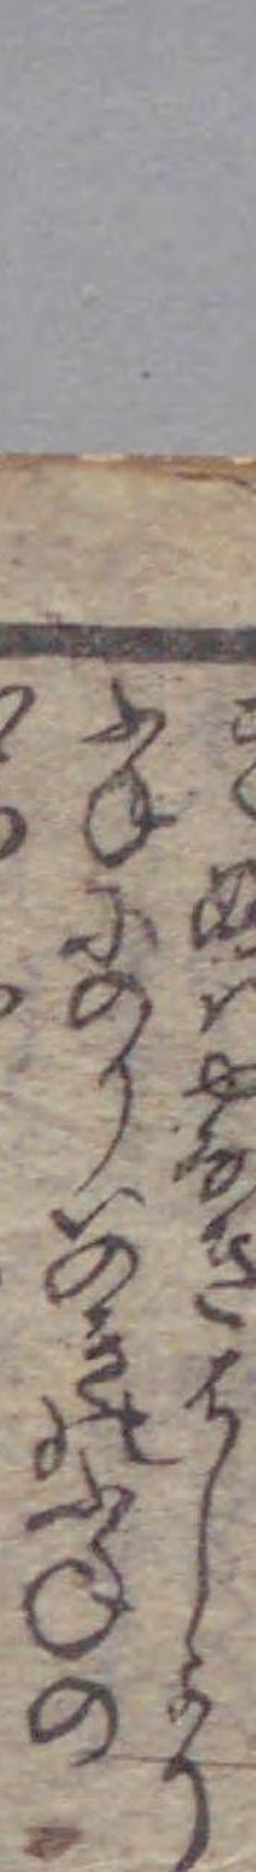ふねにのりいのきのふねの
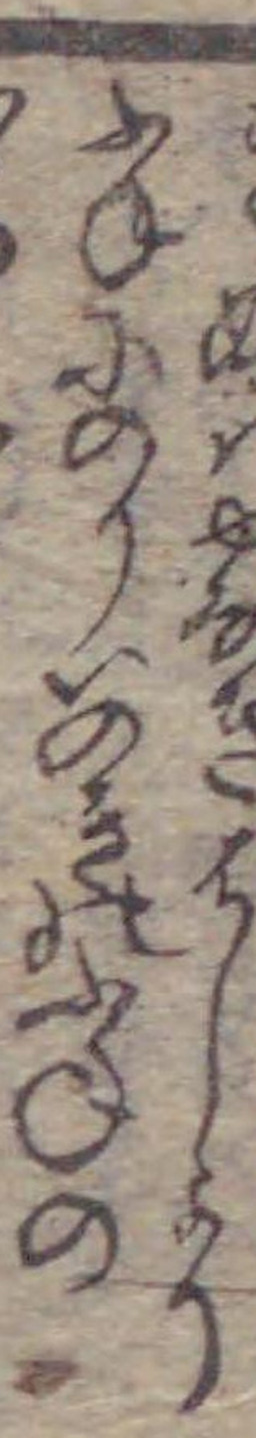ふねにのりいのきのふねの
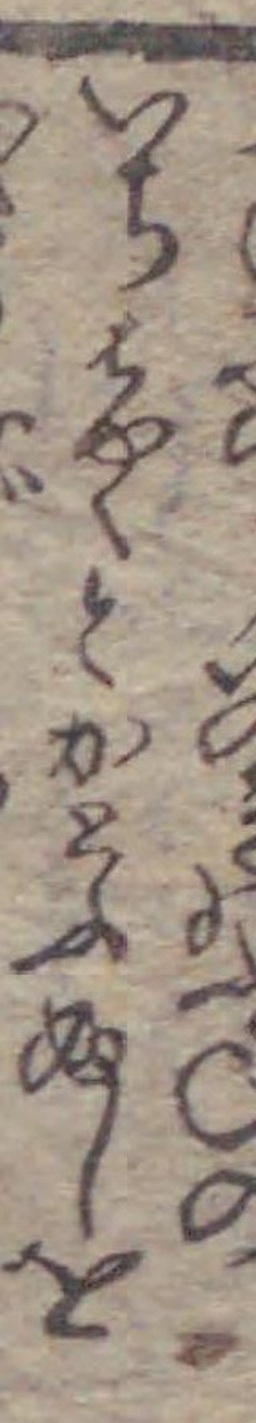いちはやくとかとふふしを
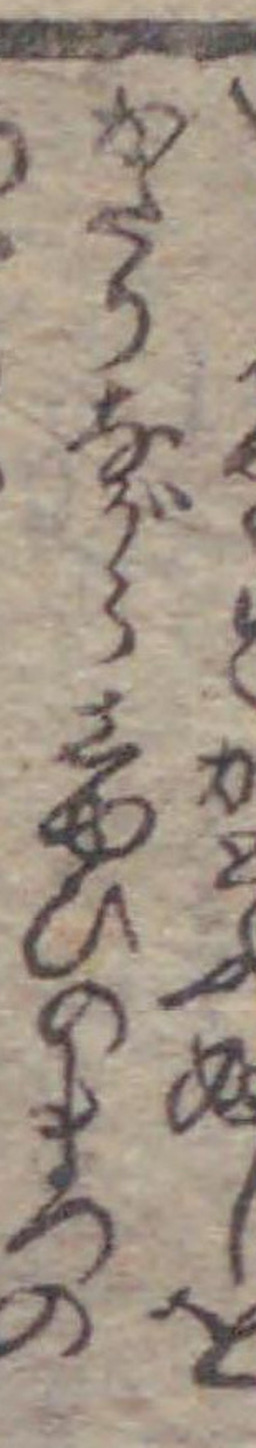かたりながらしゆひのまつの
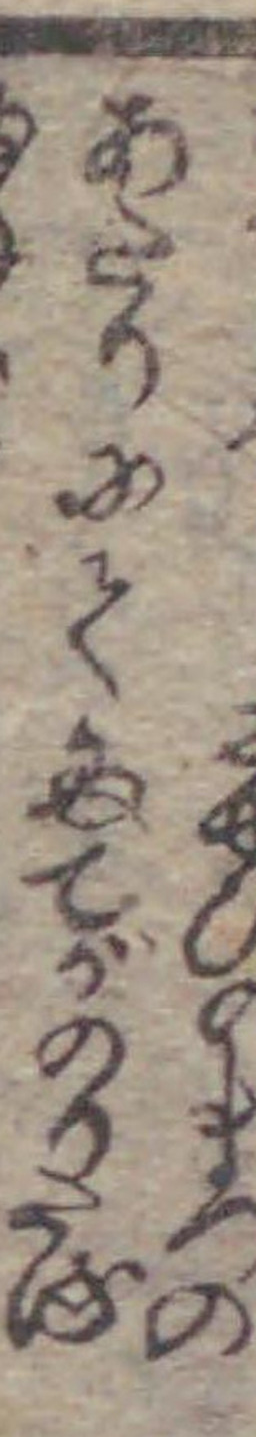あたりにてたてがのりたる
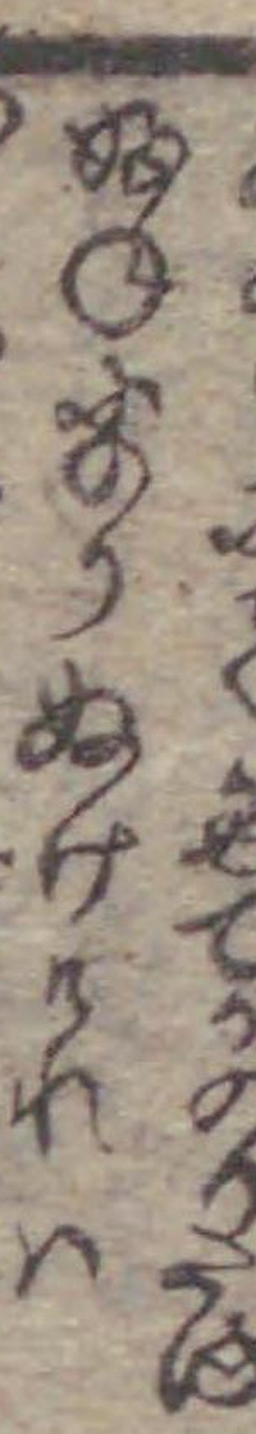ふねにのりぬけけれは
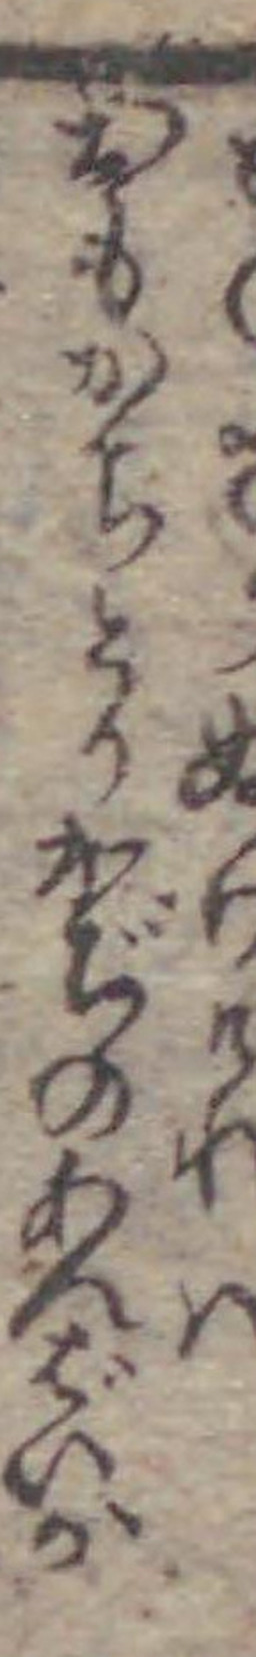おもかちとりかぢのあんばいか
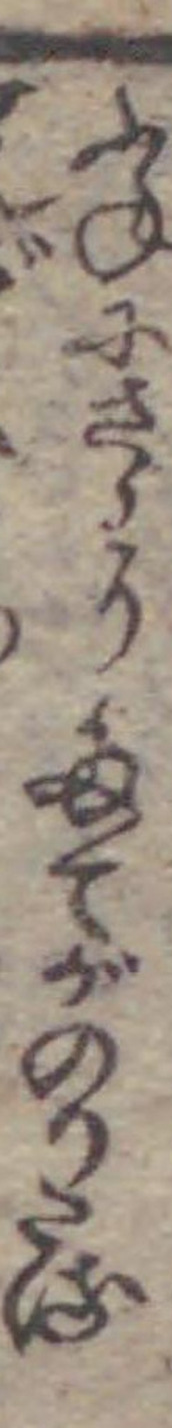ふねにさわりたてがのりさる
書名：談芭菰誉詞 : 3巻
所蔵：国立国会図書館 National Diet Library, JAPAN
